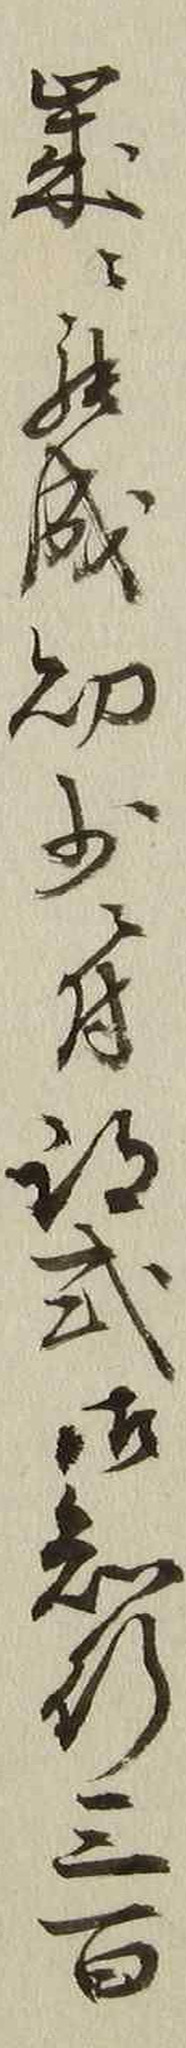歳ニ罷成幼少ニ付跡式御知行三百
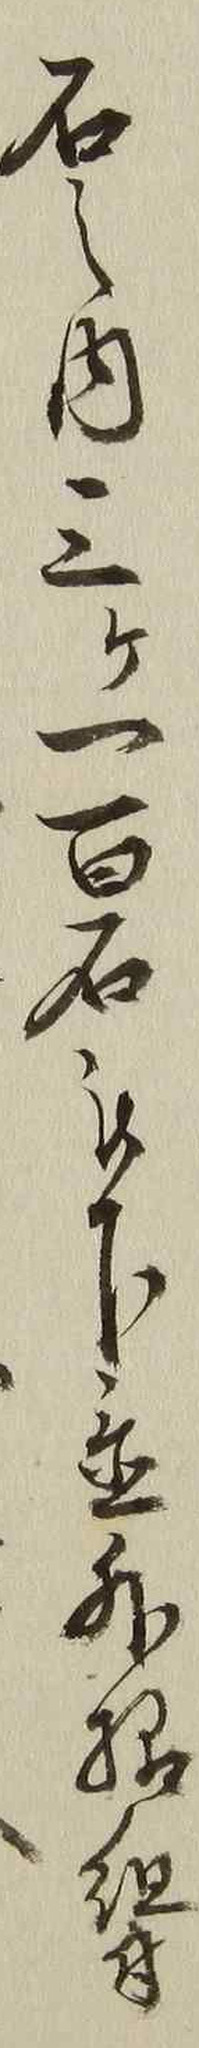石之内三ケ一百石被下置外様組付
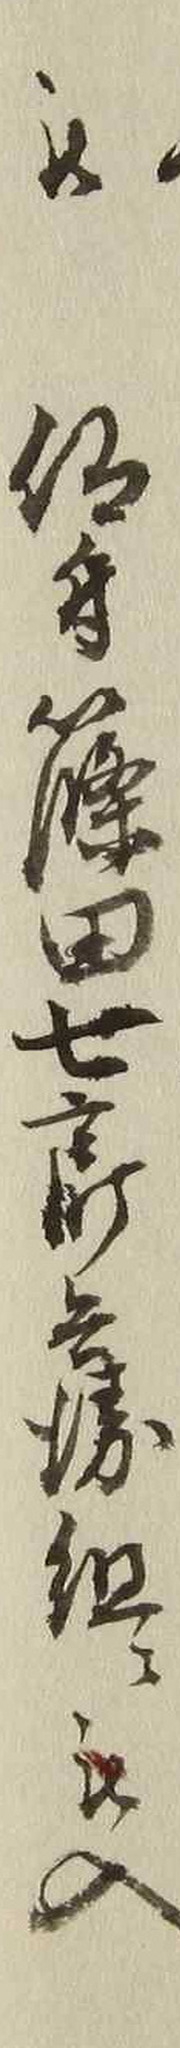被仰付篠田七郎兵衛組ニ被入
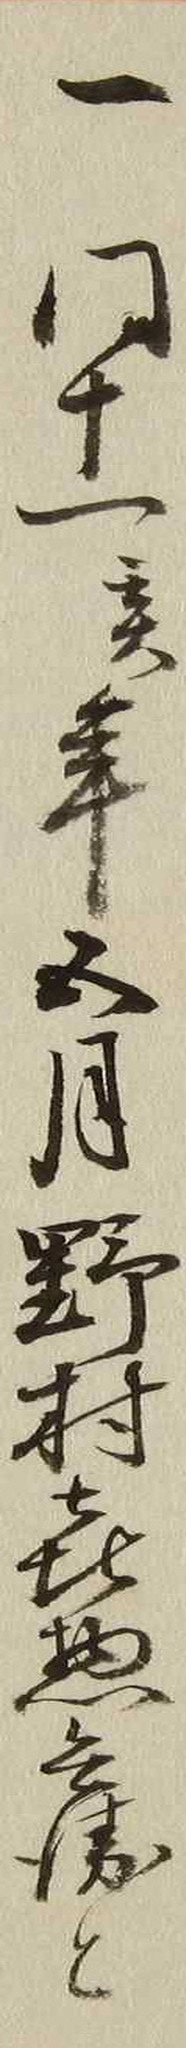一同十一亥年五月野村喜惣兵衛と
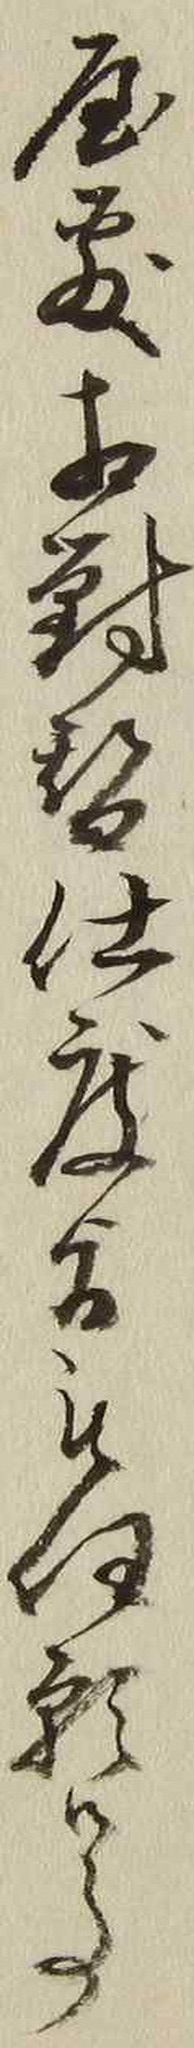屋敷相対替仕度旨被任願候事
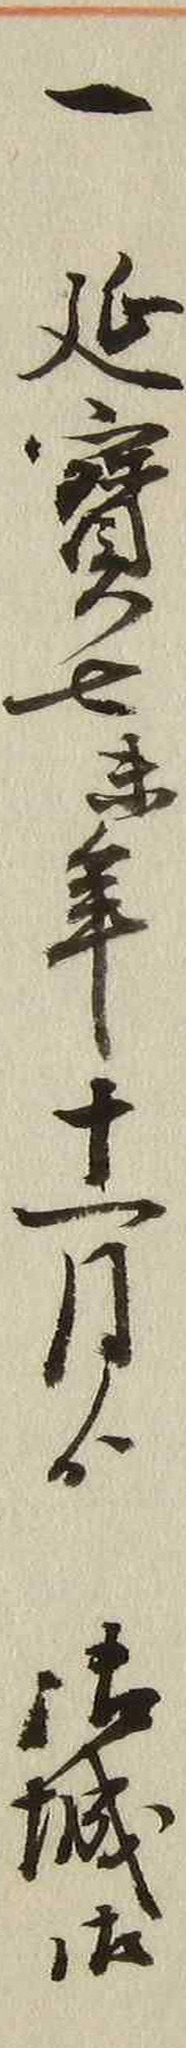一延宝七未年十一月ゟ御城御
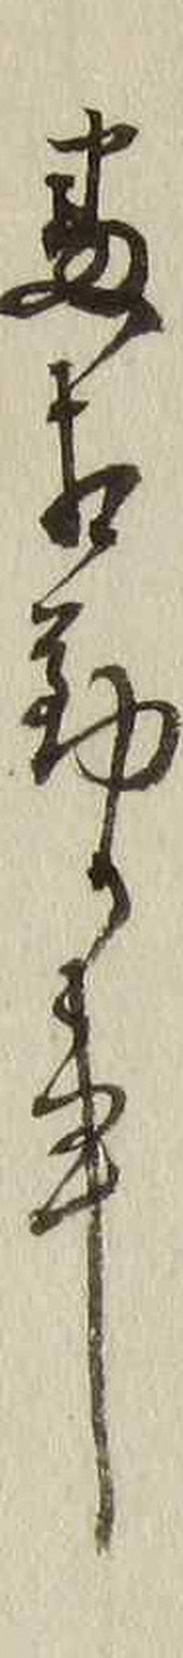番相勤候事
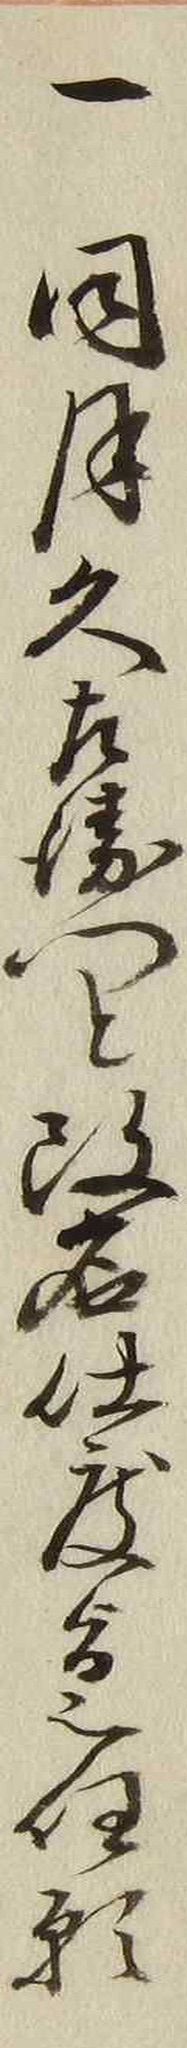一同月久左衛門と改名仕度旨被任願
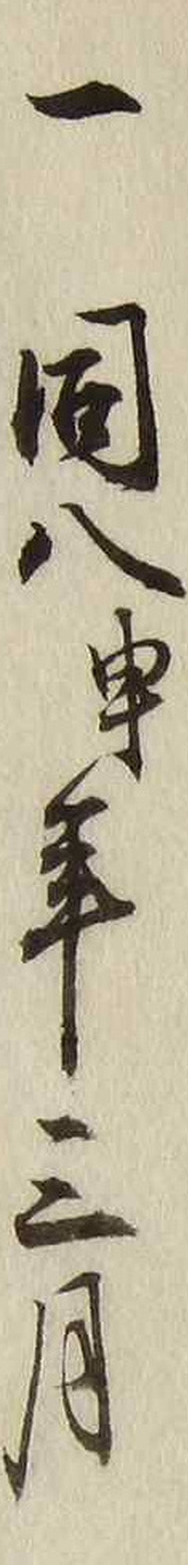一同八申年三月
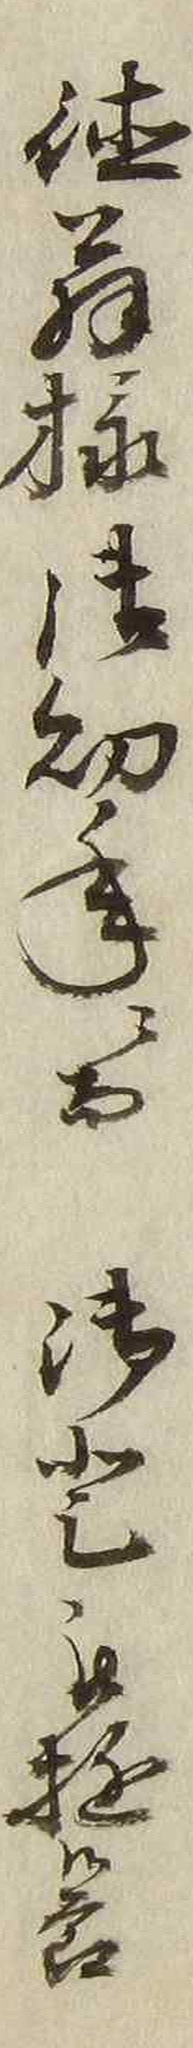徳翁様御幼年ニ而御登被遊候節
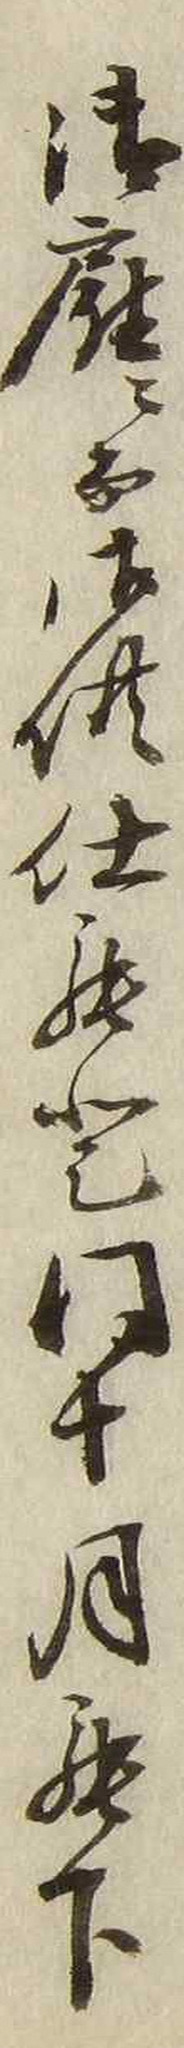御雇ニ而御供仕罷登同十月罷下

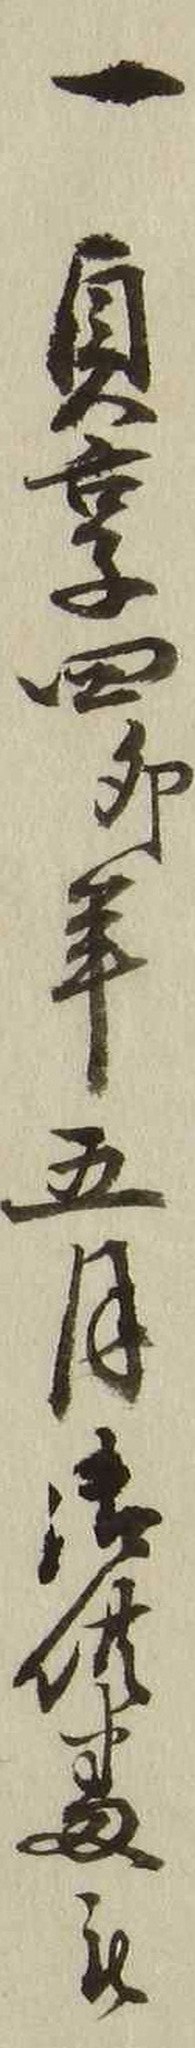一貞享四卯年五月御供番被
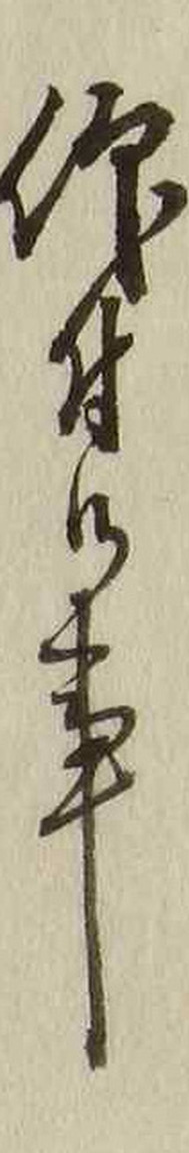仰付候事
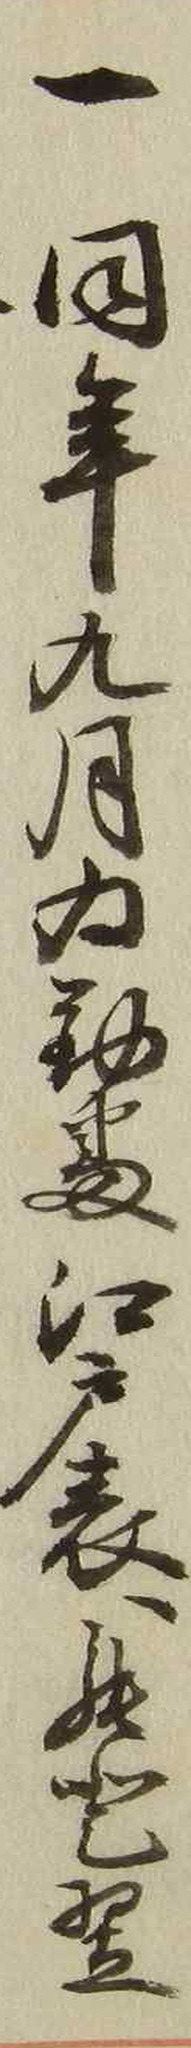一同年九月為勤番江戸表へ罷登翌
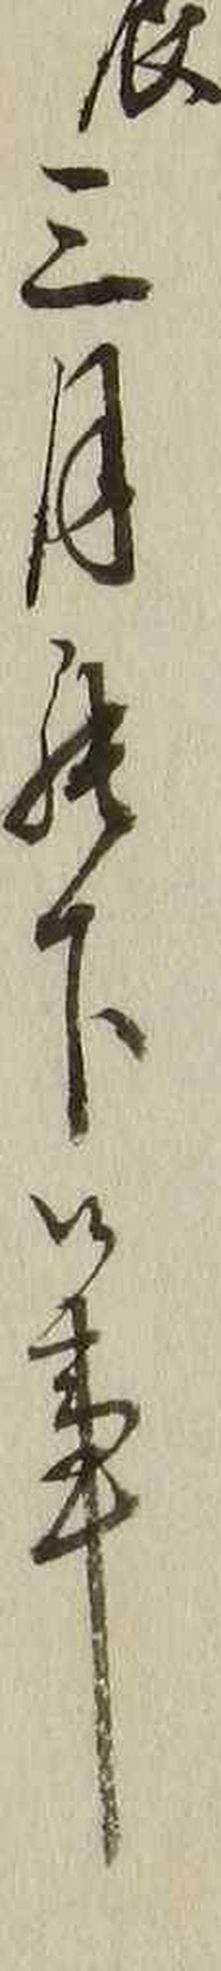辰三月罷下候事
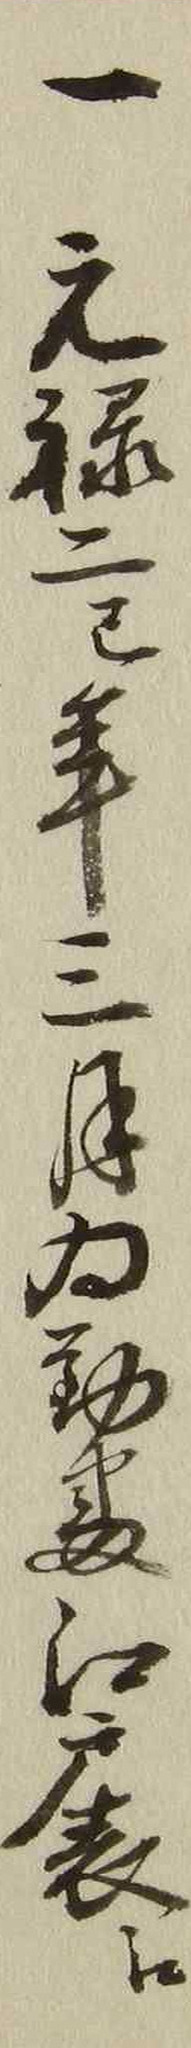一元禄二巳年三月為勤番江戸表江
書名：諸士系譜　巻之23　い之部23
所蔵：会津若松市立会津図書館
